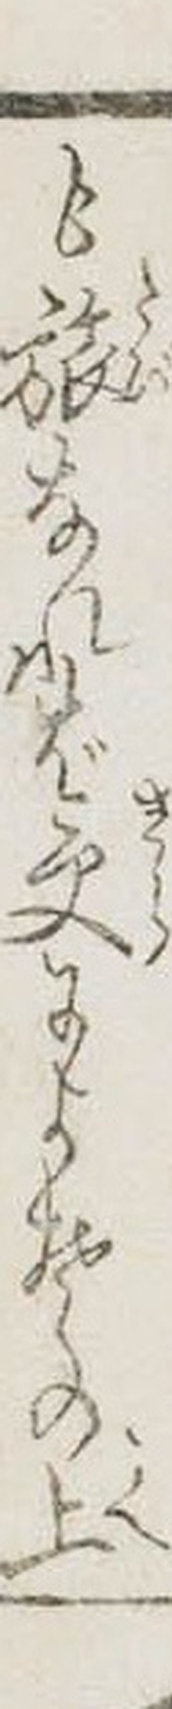も旅なれば更によその上
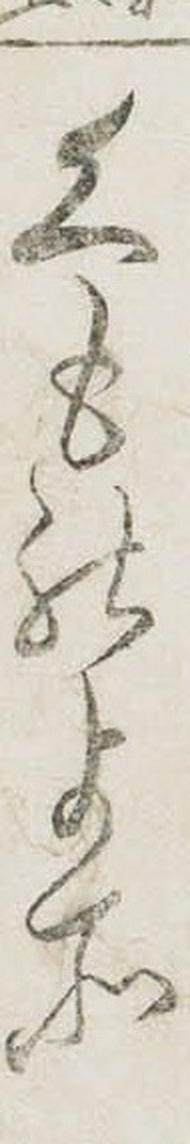くものよそ
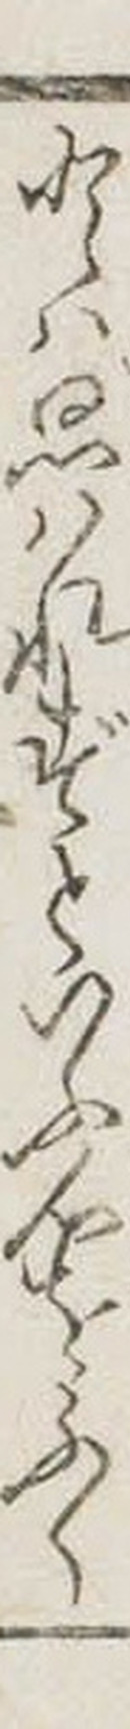とは思はれずといふ心をふく
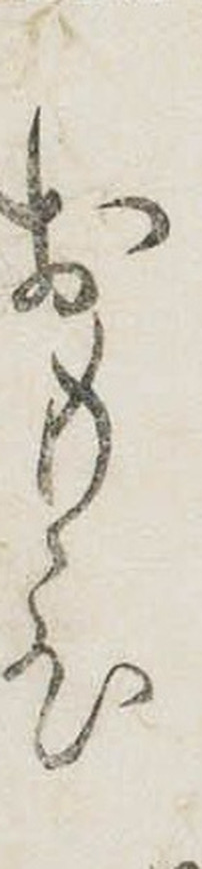おもひ

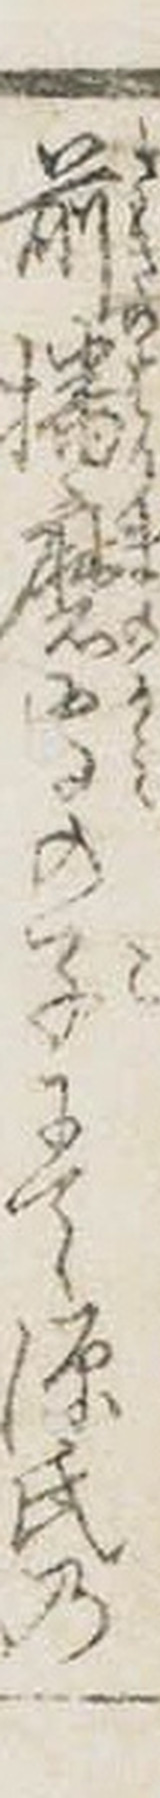前播磨守の子にて源氏の
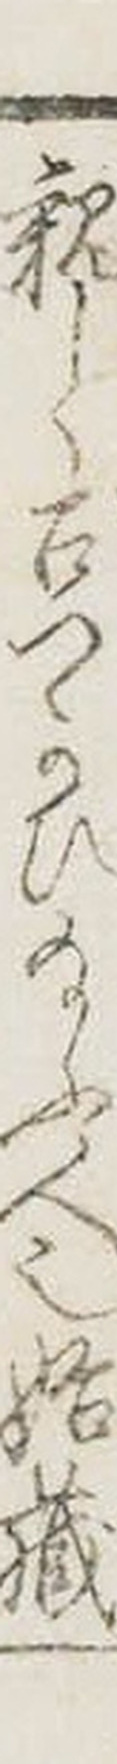親しく召つかひ給ふ人也始蔵
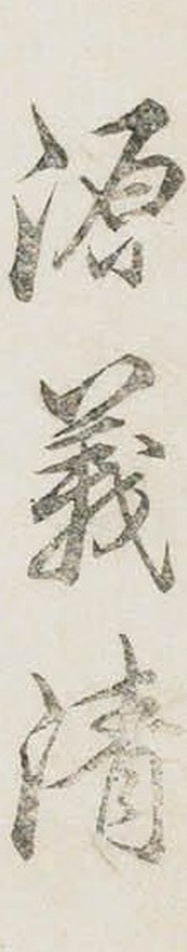源義清
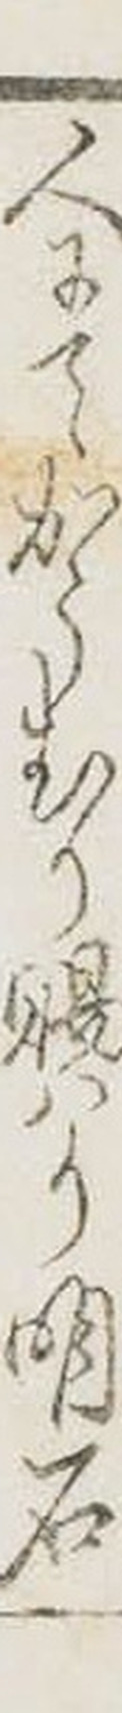人にてかうむり賜はり明石
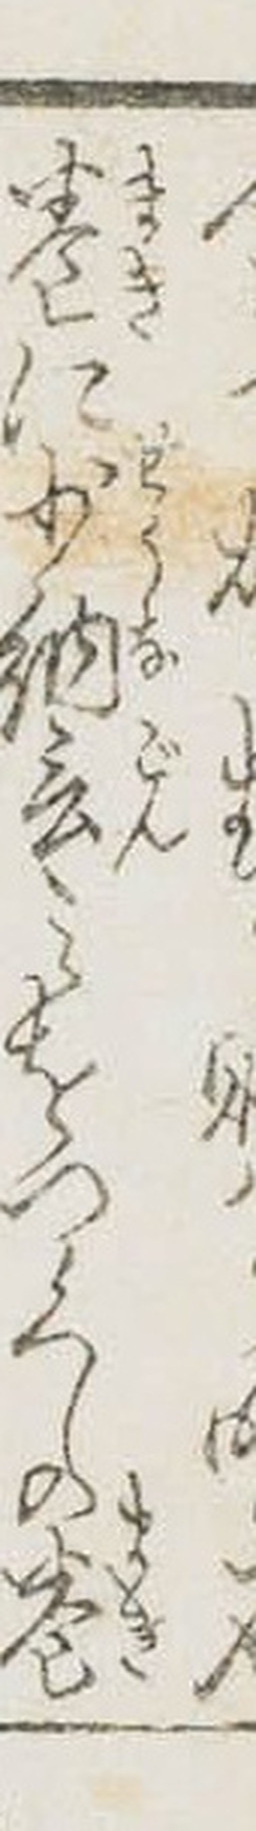巻に少納言みをつくしの巻
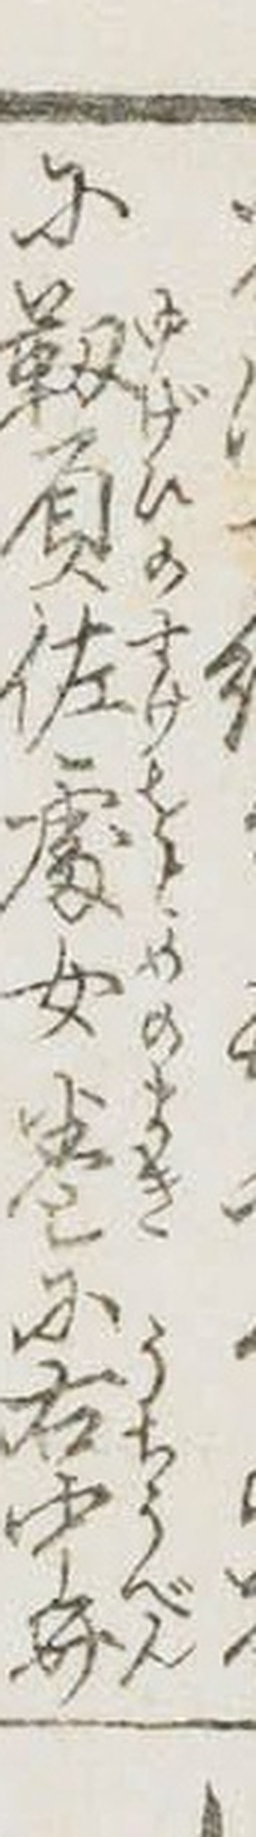に靫負佐処女巻に右中弁
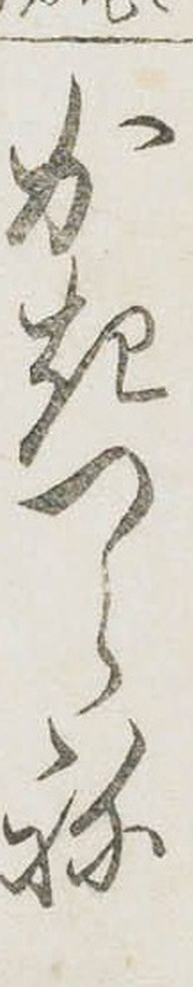かきつらね
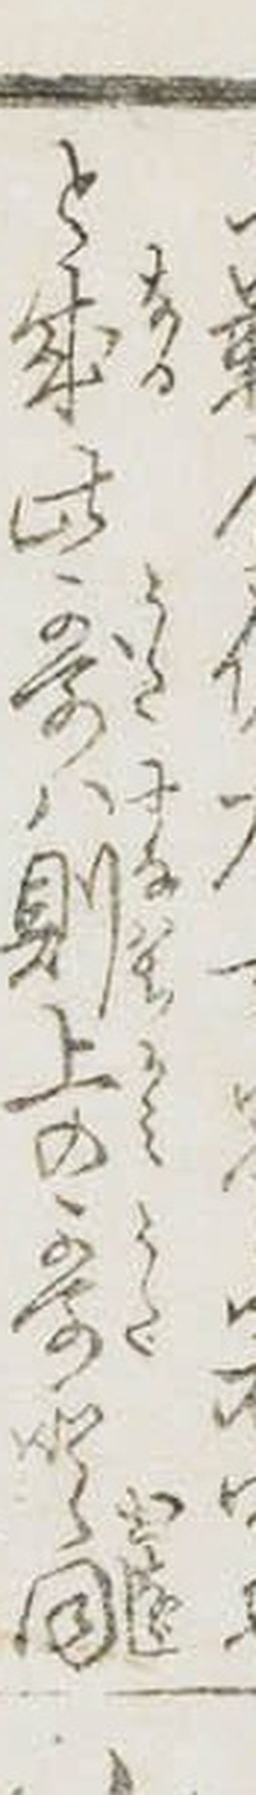と成此哥は則上の哥と同
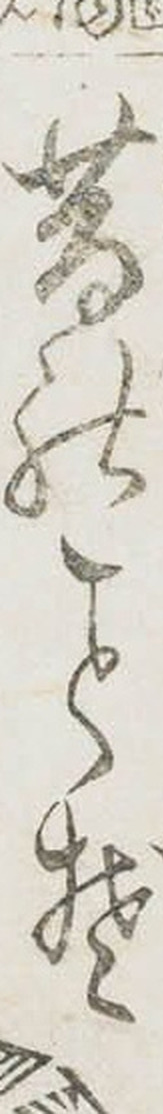昔のことぞ
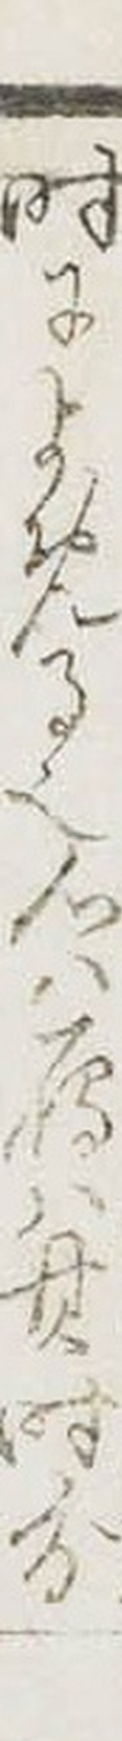時によめる也心は鴈は其時分
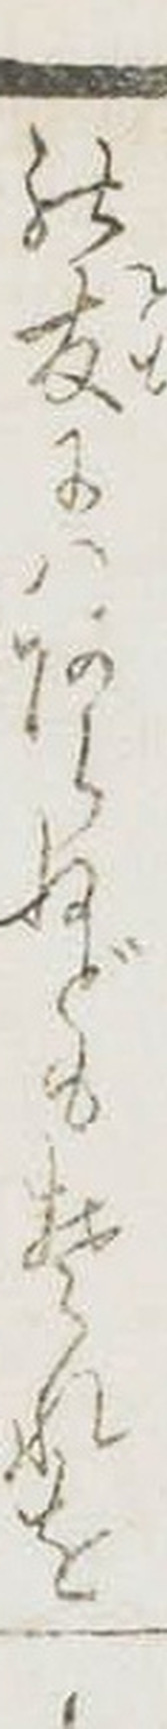の友にはあらねどもそれを
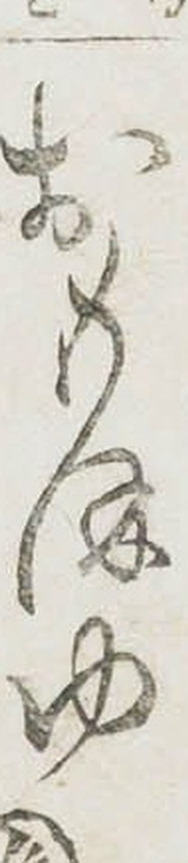おもほゆ
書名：源氏百人一首
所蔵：東京学芸大学教育コンテンツアーカイブ
